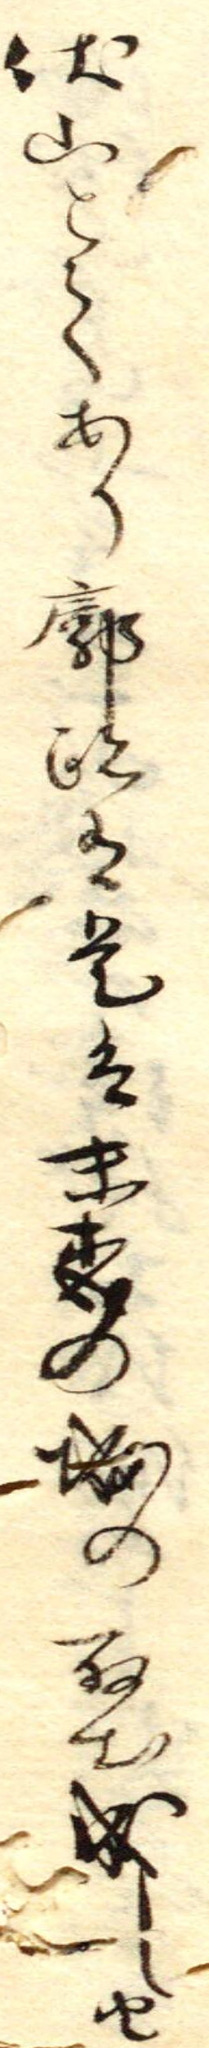伏山とてあり廓路有是は末森の城の取出成し由

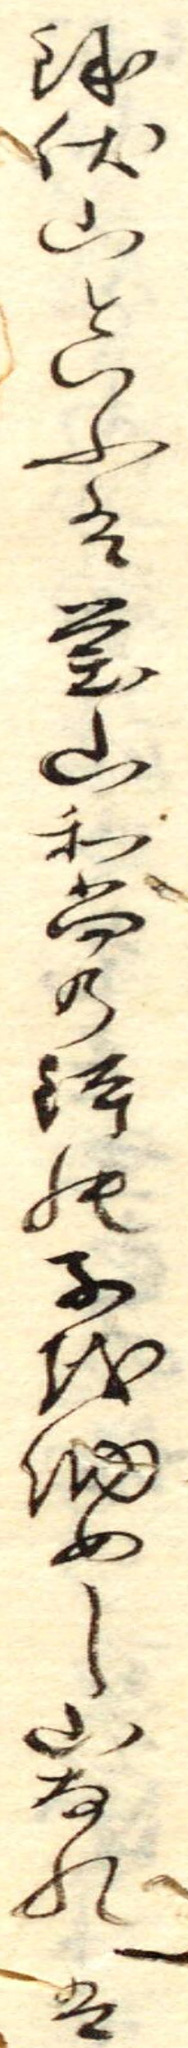躰伏山といふは瑩山和尚の躰の子を納し山なれは
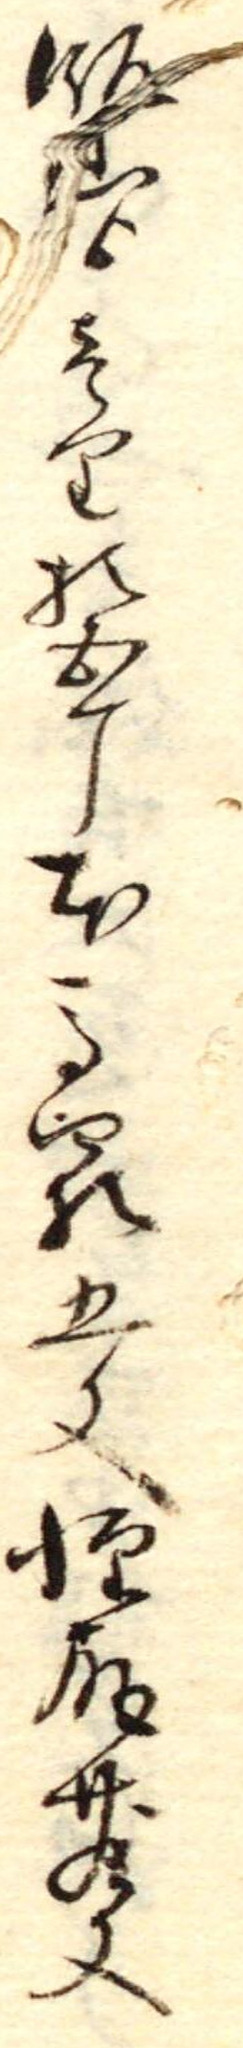飯山ゟ壱里拾五丁本馬四拾五文軽尻廿九文
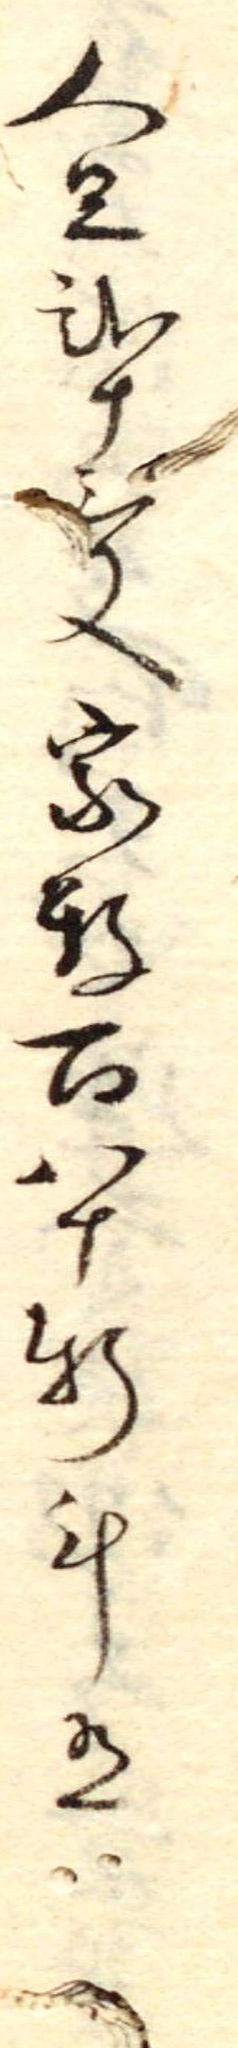人足弐十三文家数百八十軒計有
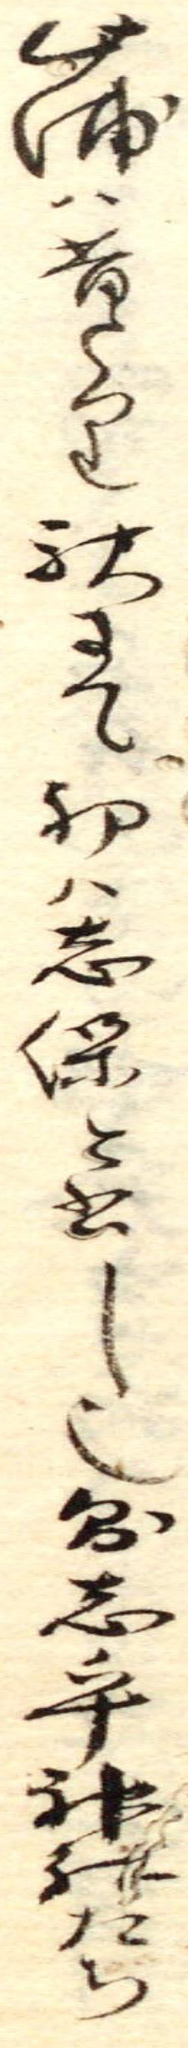此浦は昔より駅にて初は志保と書し也則志乎神社たち
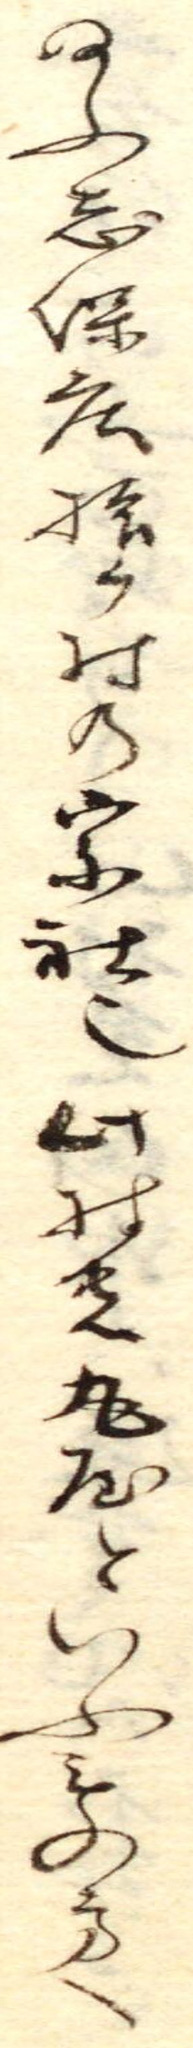給ふ志保庄拾ヶ村の宗社也此村の丸屋といふもの方へ
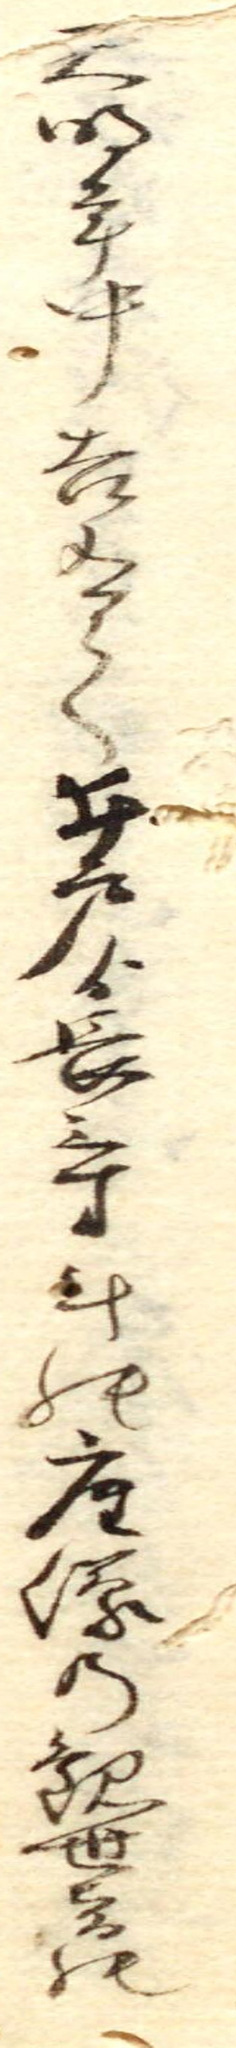天明年中吉有て井戸ゟ長三寸計の座像の観世音の
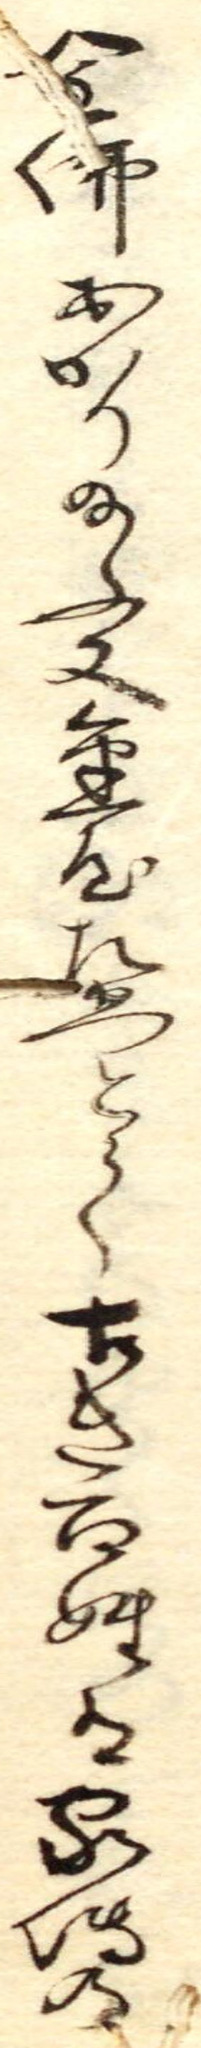金仏あかり給ふ又金屋左衛門とて古き百姓有家伝の
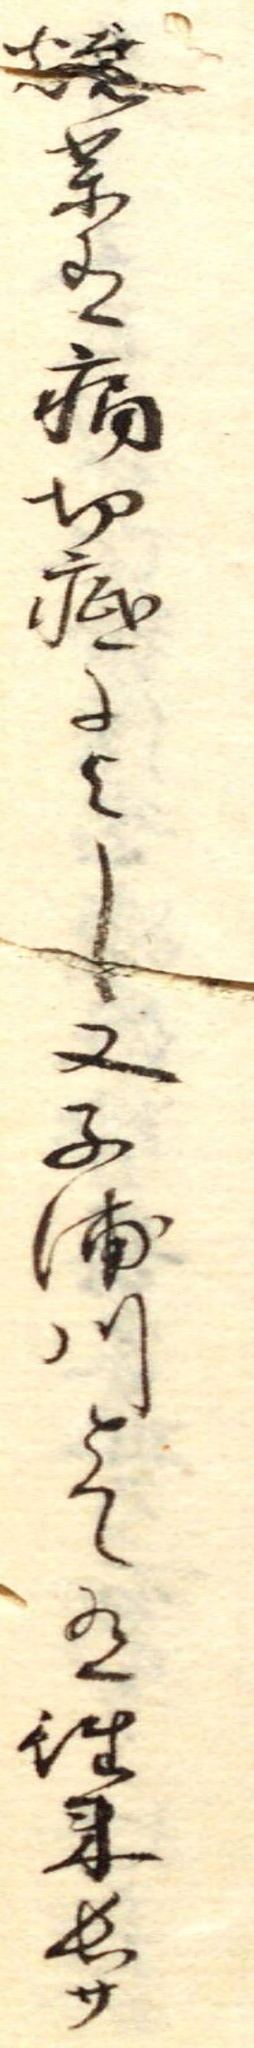焼薬有痛切疵によし又子浦川とて有往来長さ
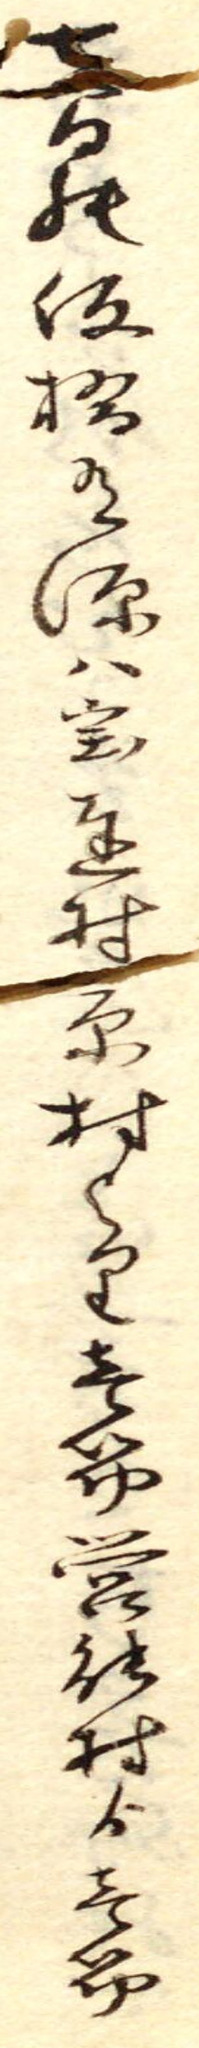七間の仮橋有源は宝達村原村より壱筋営能村ゟ壱筋
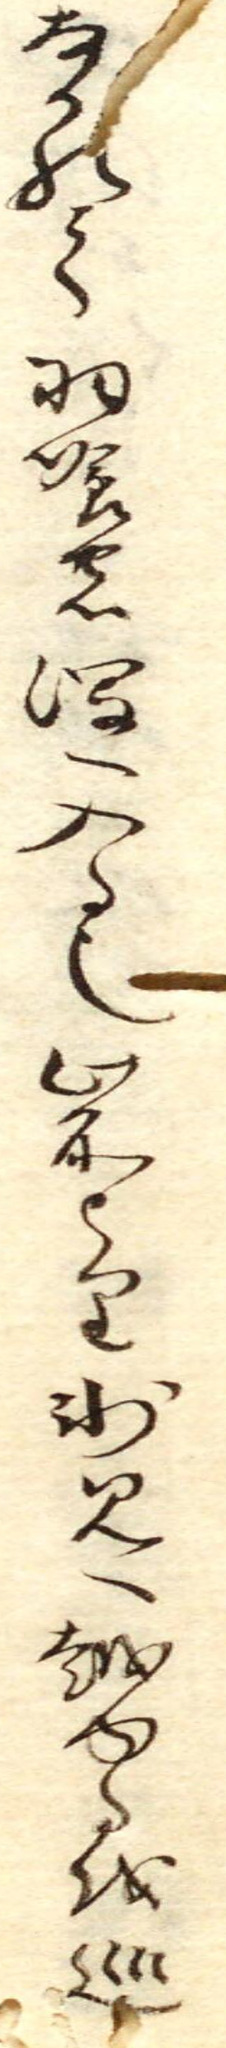なかれて羽喰の潟へ入る也此所より氷見へ越ゆるを巡
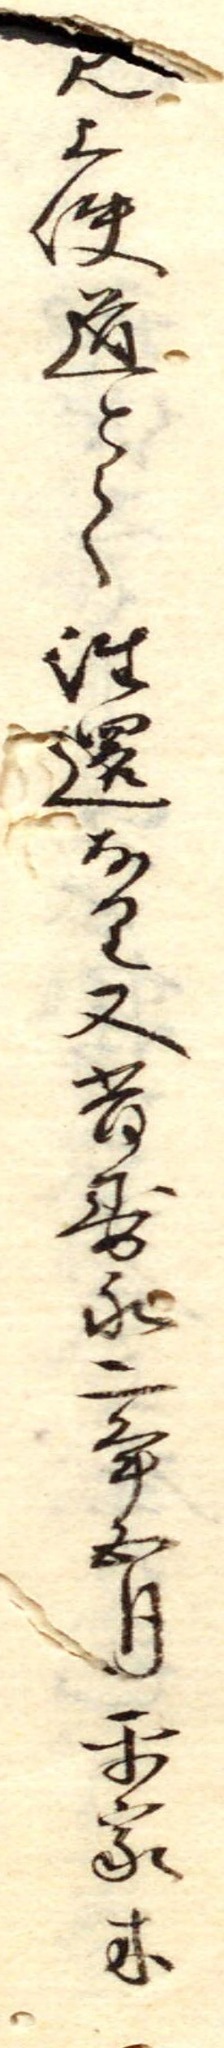見上使道とて往還なり昔寿永二年五月平家木
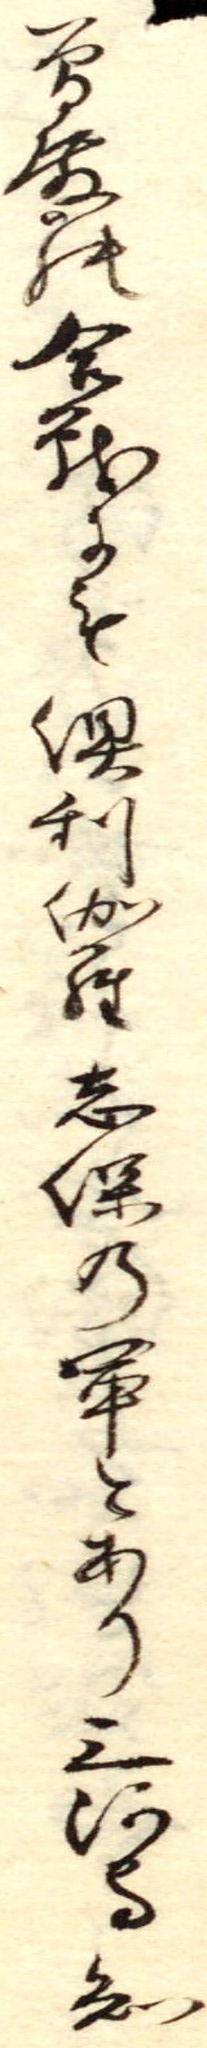曽殿の合戦にも倶利伽羅志保の軍とあり三河守知
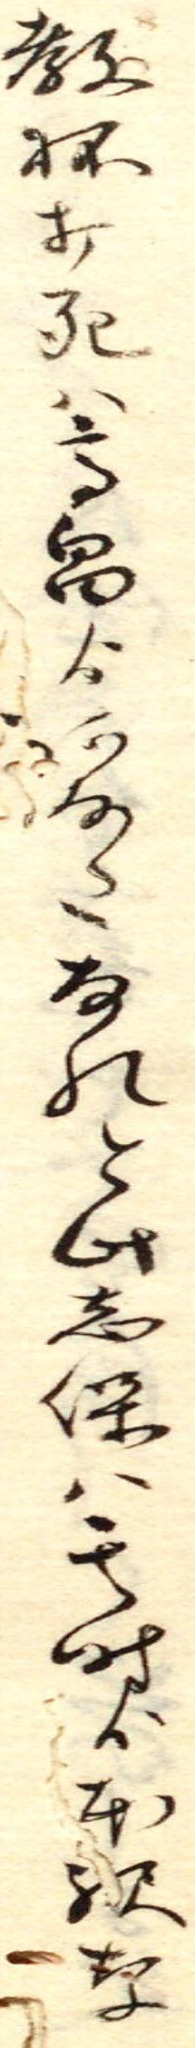教抔打死は高畠ゟあなたなれと此志保は其時ゟ本駅な
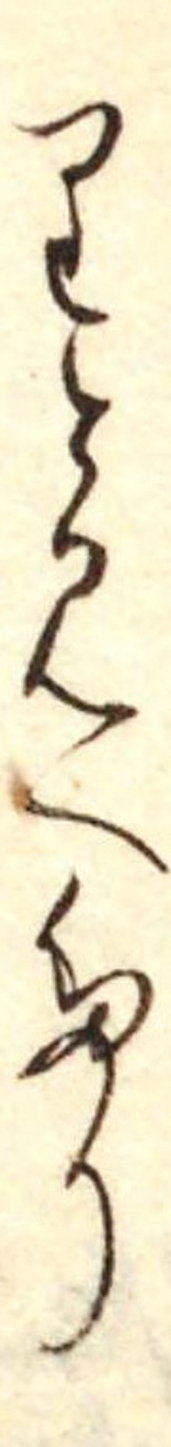りと見へたり
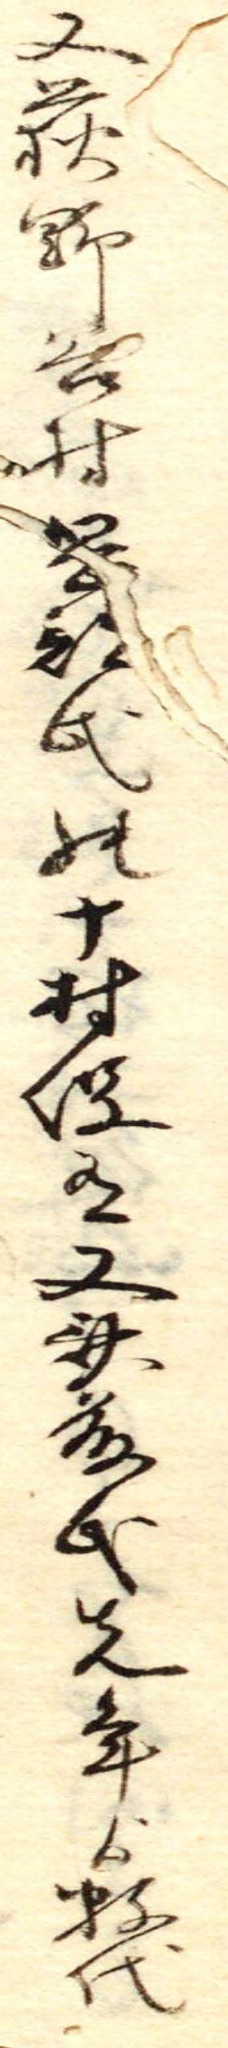又萩野谷村岡部氏の十村役有又斎藤氏先年ゟ数代
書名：能登名跡誌
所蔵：Ishikawa Prefectural Library
